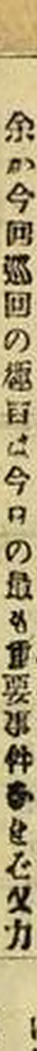余か今回巡回の趣旨は今日の最も重要事件なれば又力
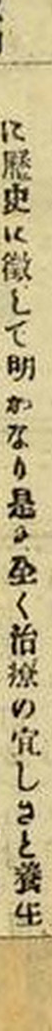に歴史に徴して明かなり是れ全く治療の宜しきと養生
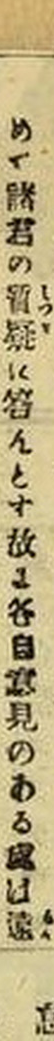めて諸君の質疑に答んとす故に各自意見のある処は遠
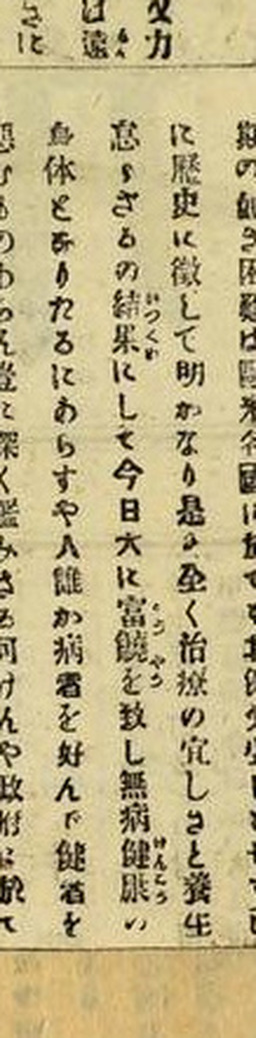怠らざるの結果にして今日大に富饒を致し無病健康の
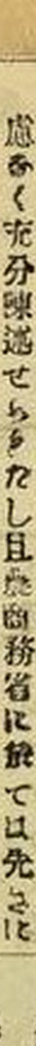慮なく充分陳述せられたし且農商務省に於ては先きに
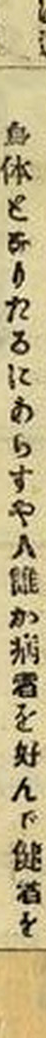身体となりたるにあらすや人誰か病者を好んで健者を
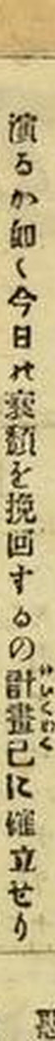演るか如く今日の衰頽を挽回するの計画已に確立せり
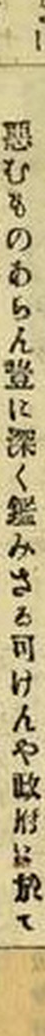悪むものあらん豈に深く鑑みさる可けんや政府に於て
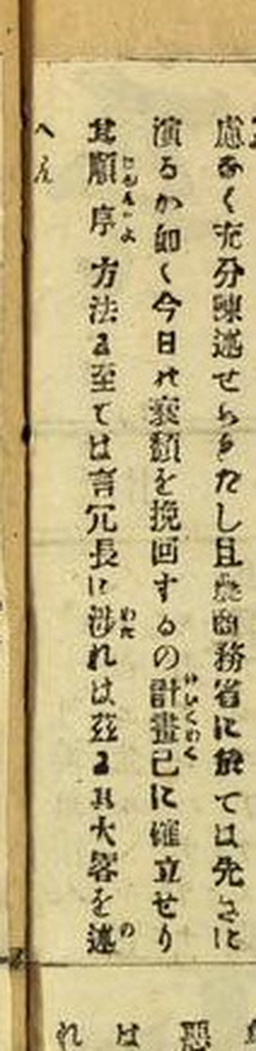其順序方法に至ては言冗長に渉れは茲に其大略を述
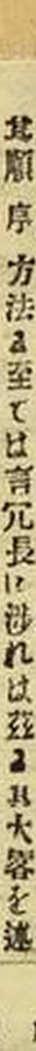其順序方法に至ては言冗長に渉れは茲に其大略を述
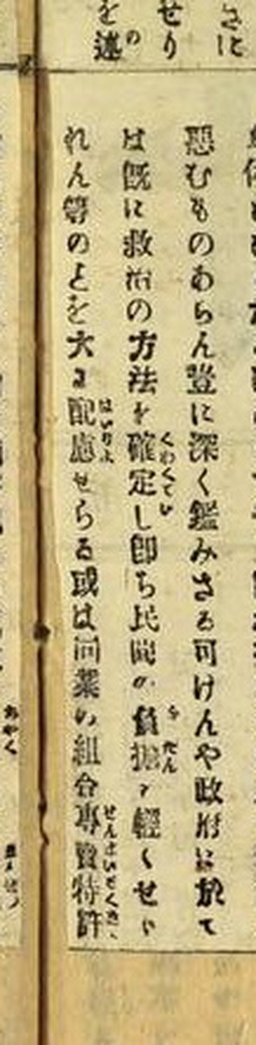は既に救治の方法を確定し即ち民間の負担を軽くせら
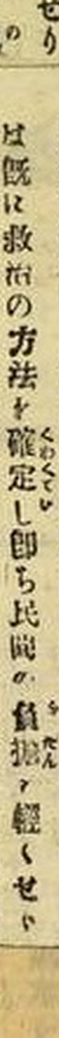は既に救治の方法を確定し即ち民間の負担を軽くせら
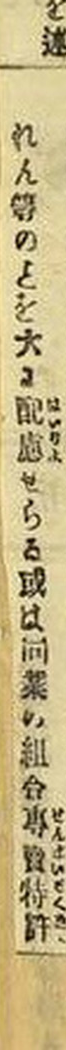れん等のことを大に配慮せらる或は同業の組合専売特許
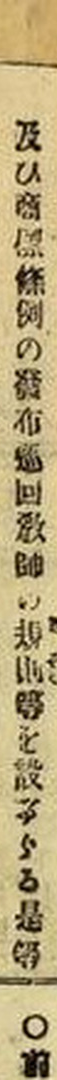及ひ商標条例の発布巡回教師の規則等を設けらる是等
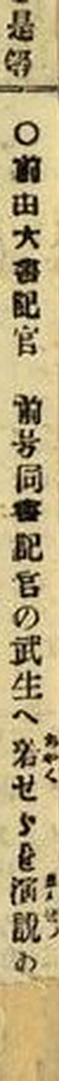〇前田大書記官前号同書記官の武生へ着せられ演説あ
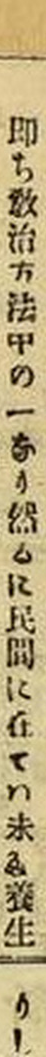即ち救治方法中の一なり然るに民間に在ては未た養生
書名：温古集 五巻
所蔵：福井県文書館 Fukui Prefectural Archives
